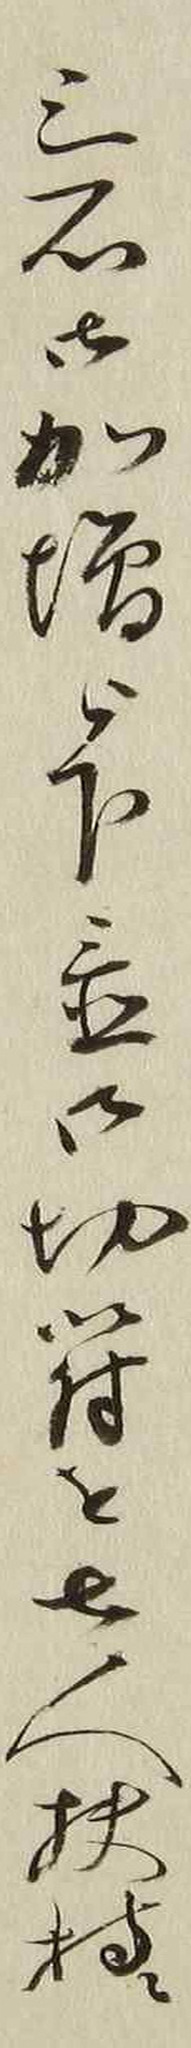三石御加増被下置御切符を七人扶持に
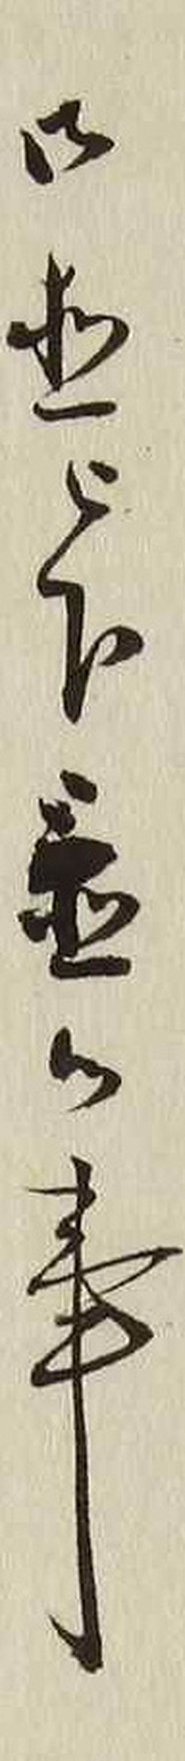御直被下置候事
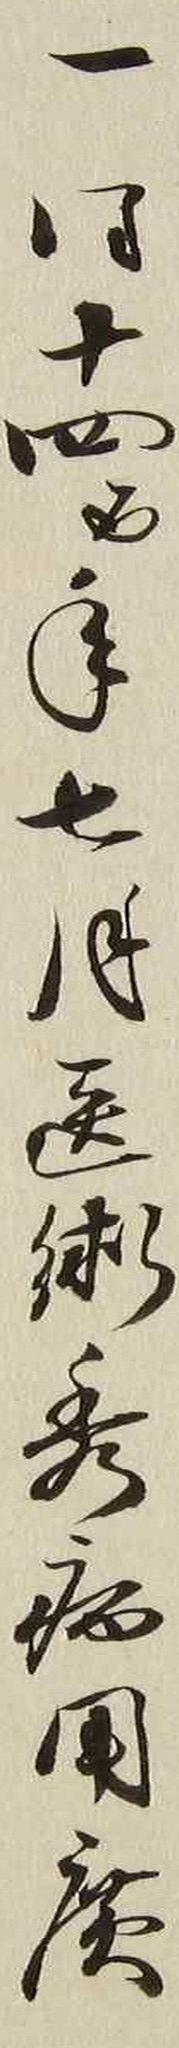一同十四酉年七月医術秀病用広
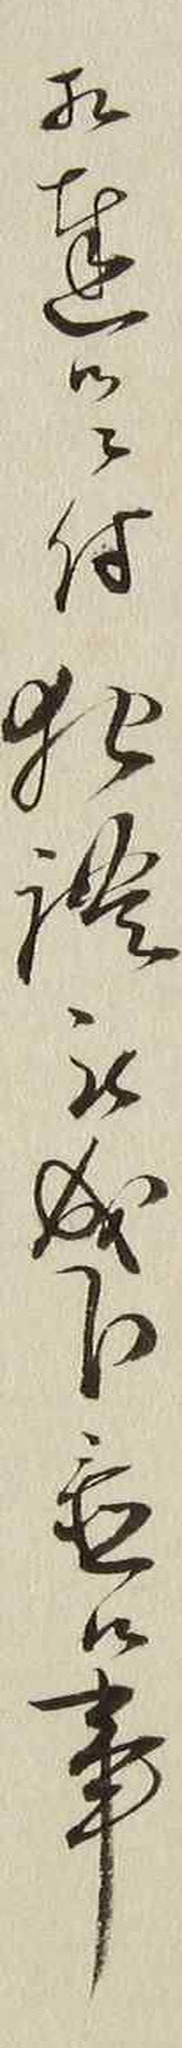相達候に付独礼被成下置候事
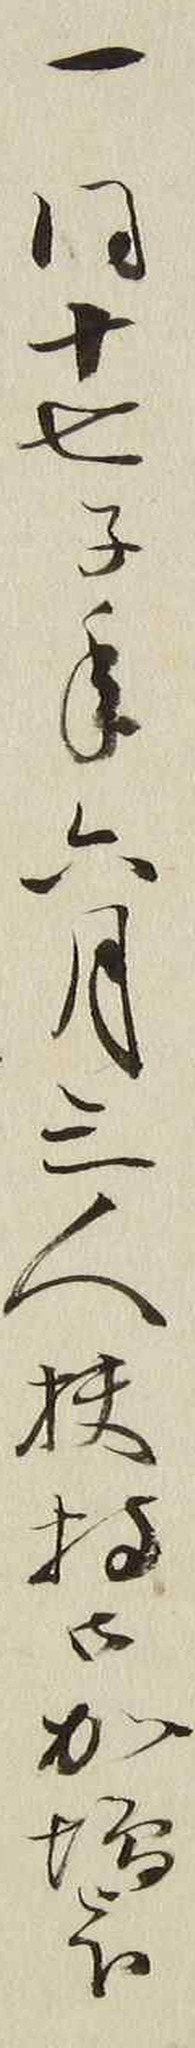一同十七子年六月三人扶持御加増被下
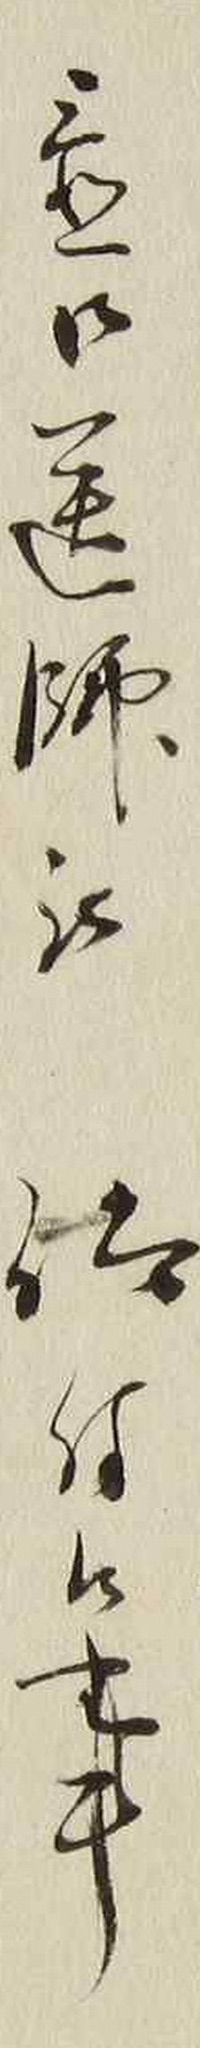置御医師被仰付候事
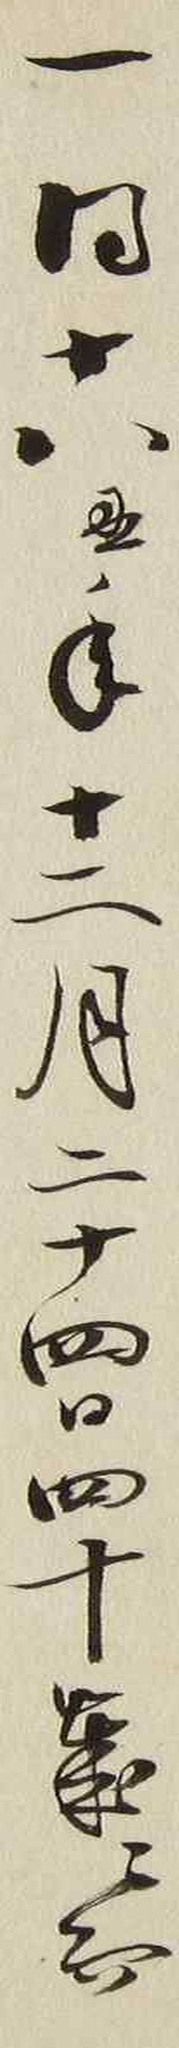一同十八丑年十二月二十四日四十歳に而
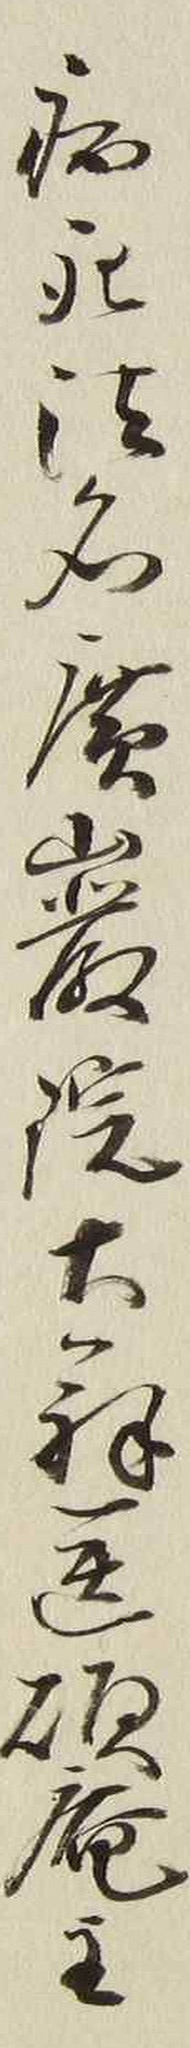病死法名広巌院大翁医碩庵主
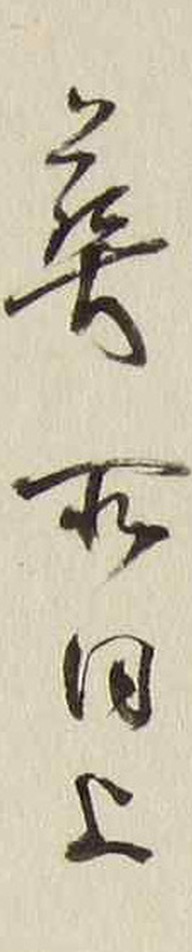葬所同上

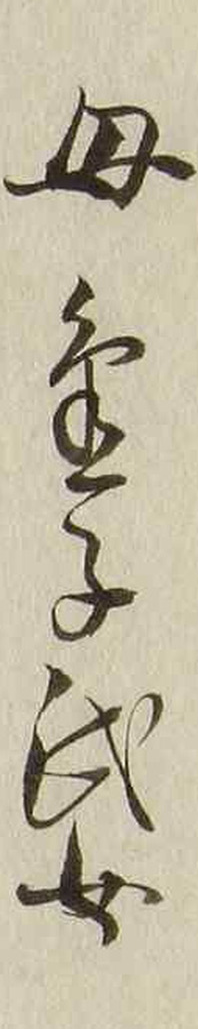母金子氏女
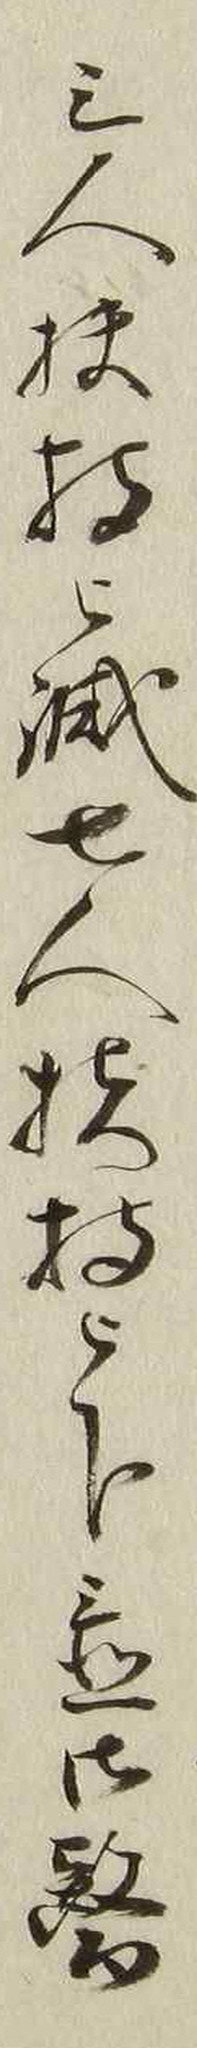三人扶持被減七人扶持被下置御医
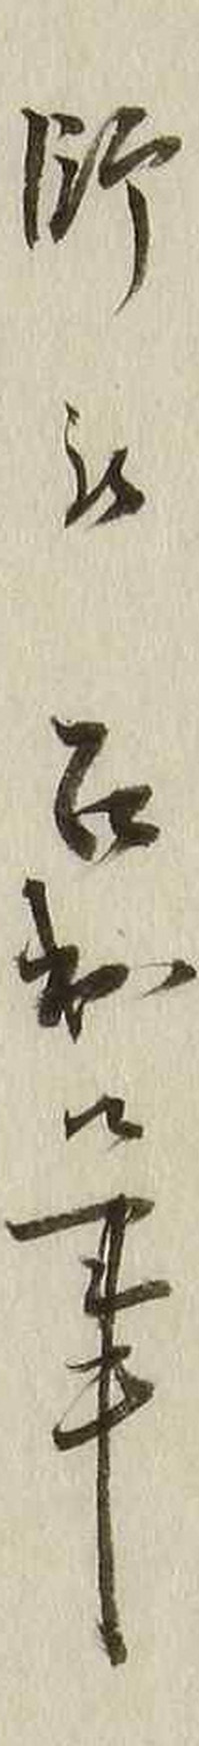師被召出候事
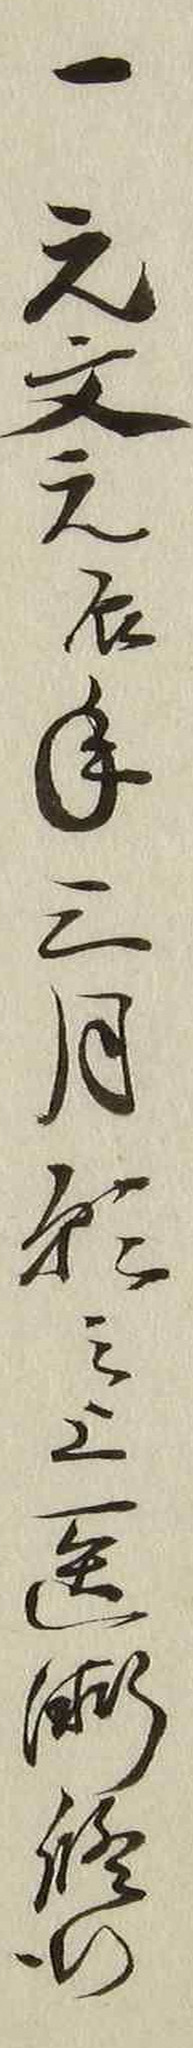一元文元辰年三月願之上医術修行
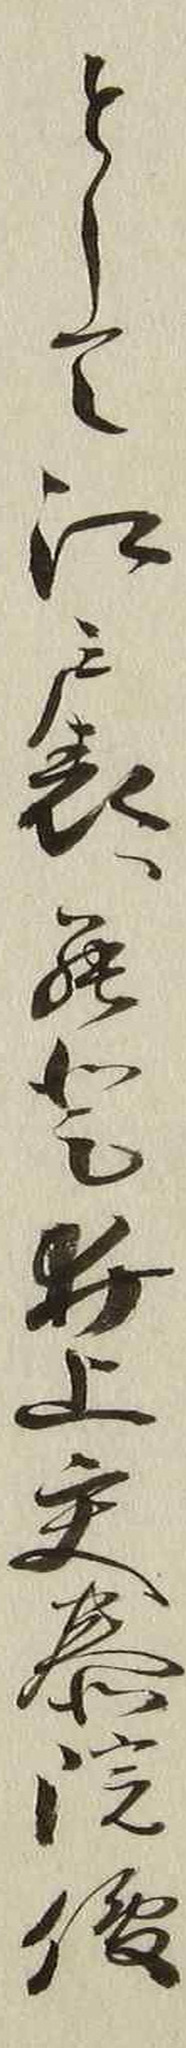として江戸表へ罷登井上交泰院俊
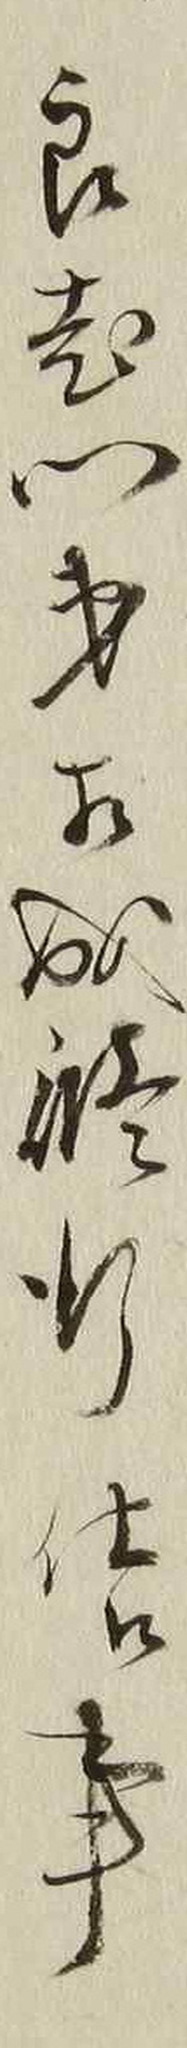良老門弟相成修行仕候事
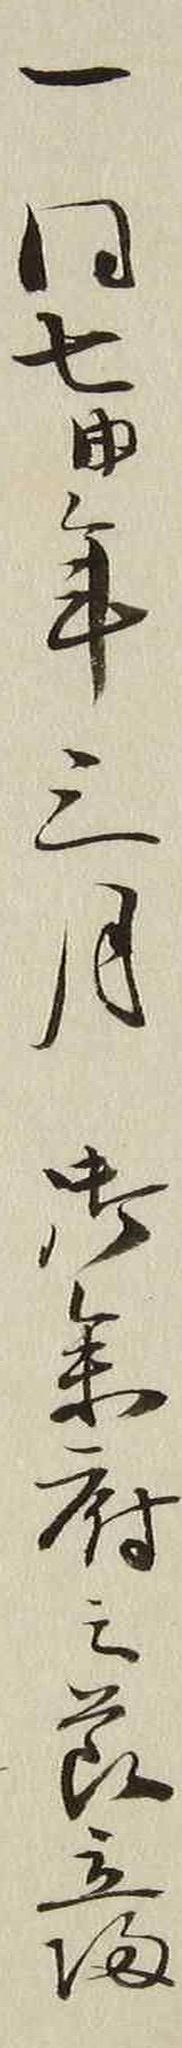一同七申年三月御参府之節立帰
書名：諸士系譜　巻之157　ね之部1
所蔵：会津若松市立会津図書館
